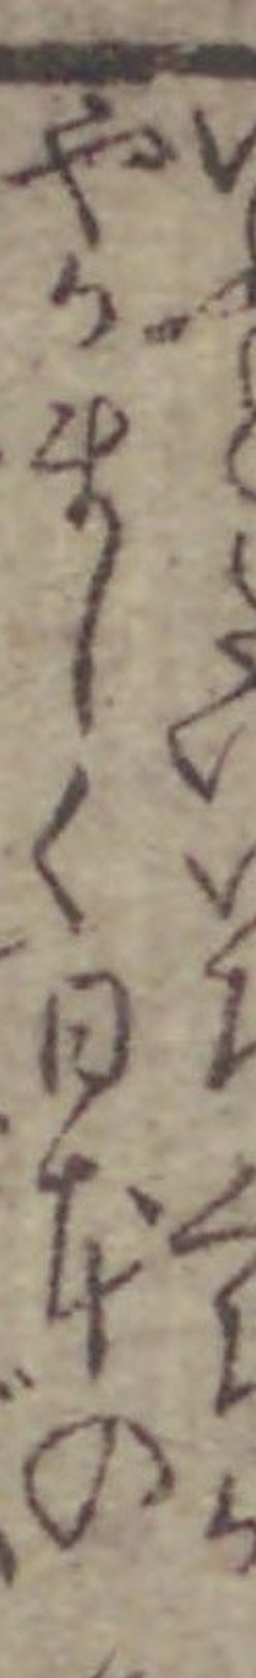やかましく日本の
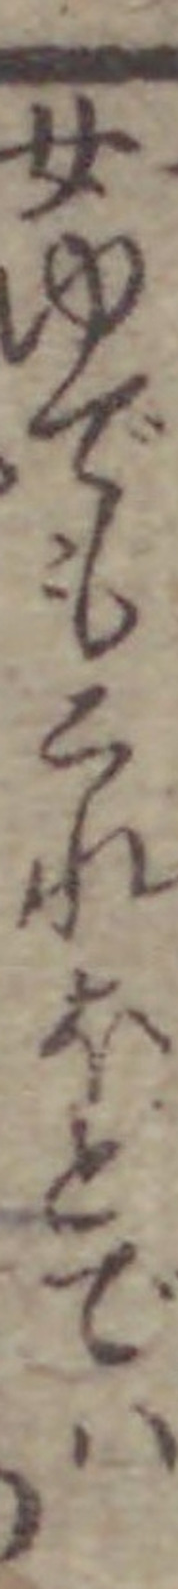女ゆでもこれほどでは
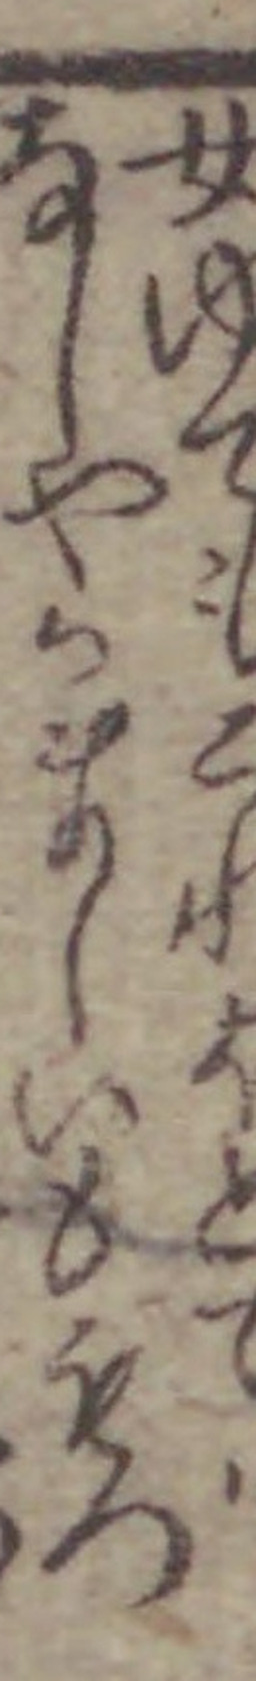なしやかましいももつ
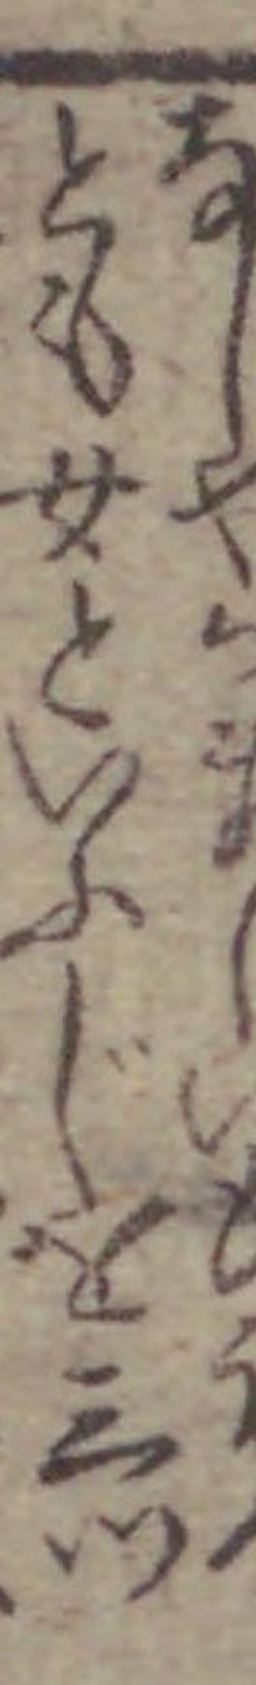とも女といふじを三つ
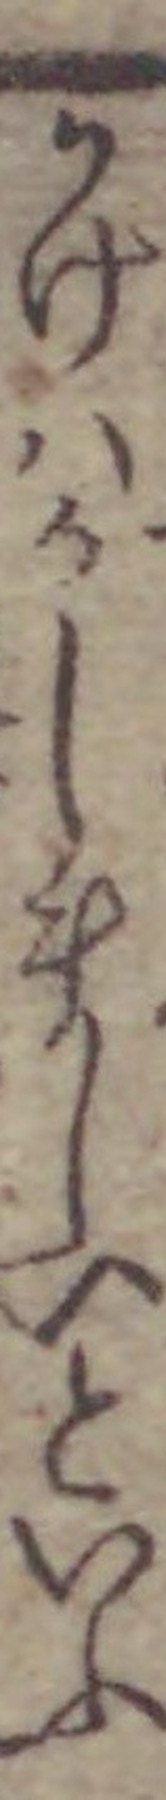かけはかしましいといふ
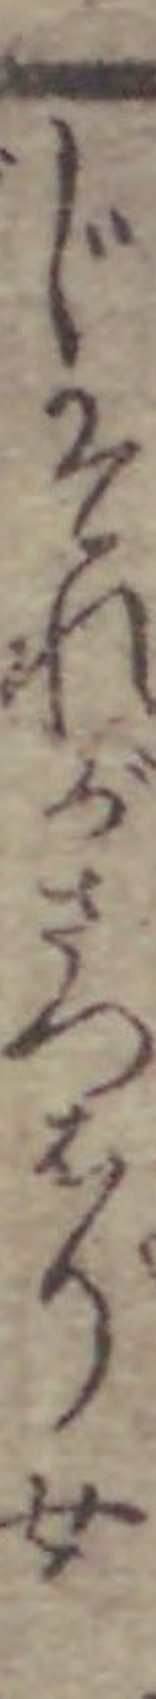じそれがさつはり女
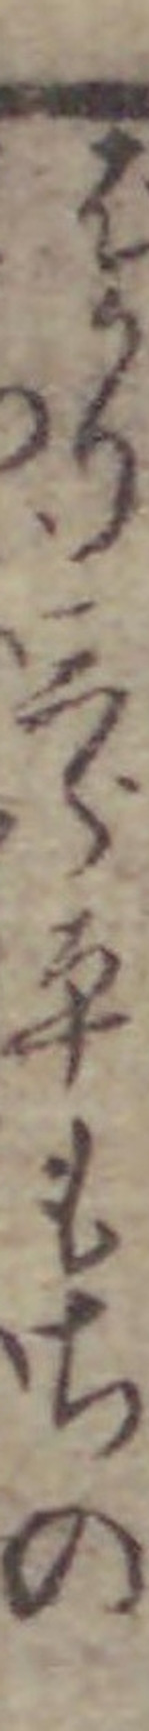ばかり三郎平もちの
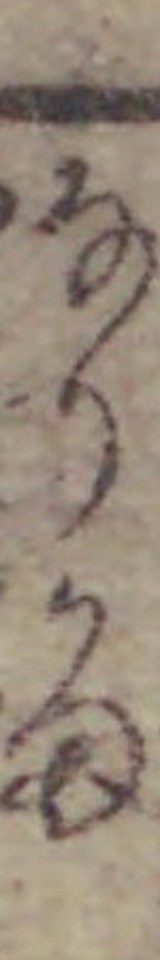なりかま
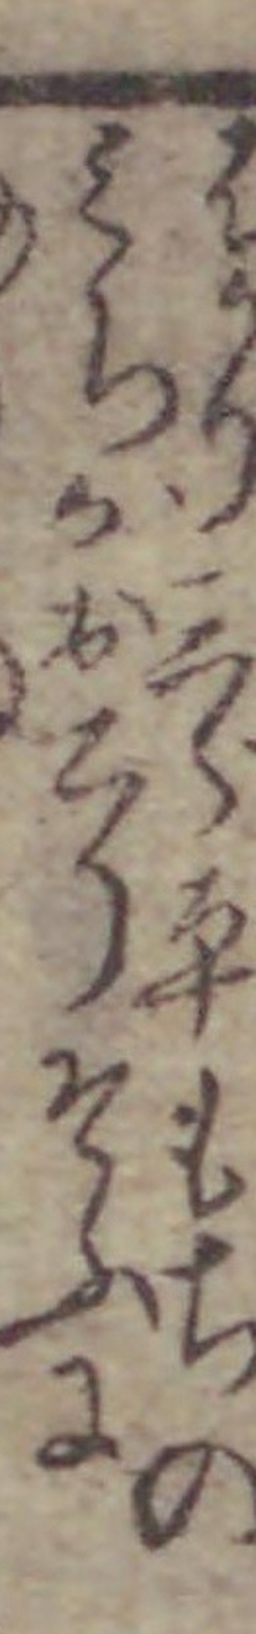みちかおこりそふに
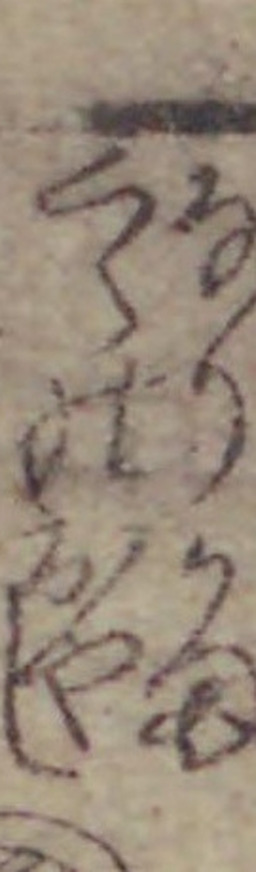くらのおやし
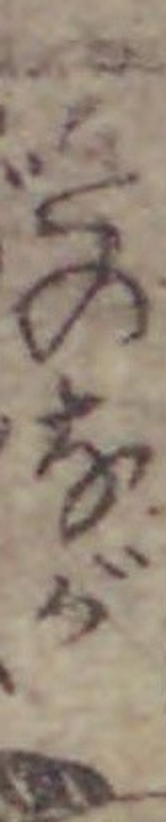きのなが
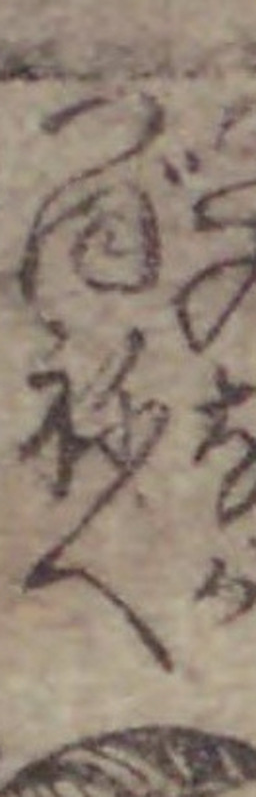つぼねへ
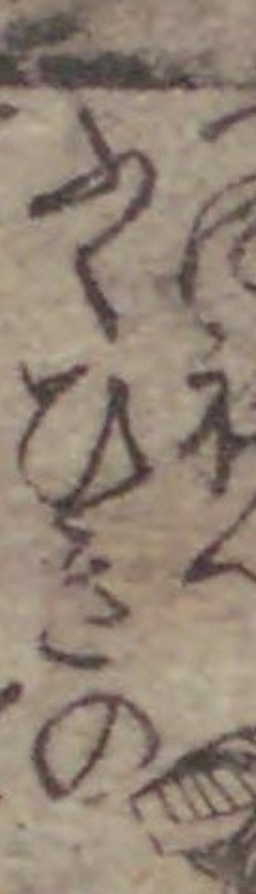ふくひきの
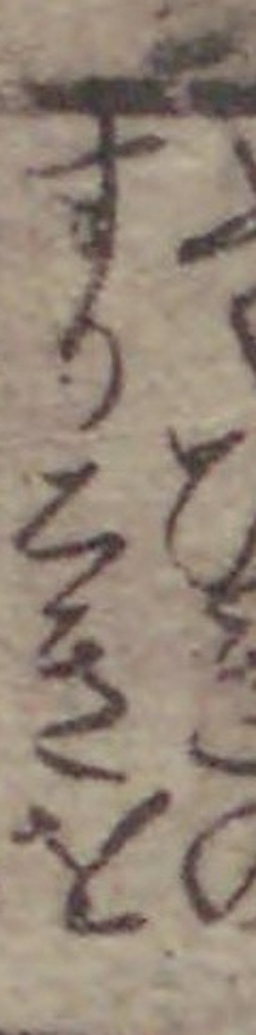すりこきを
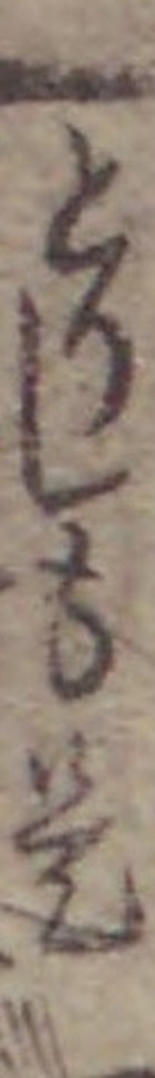とりしも是
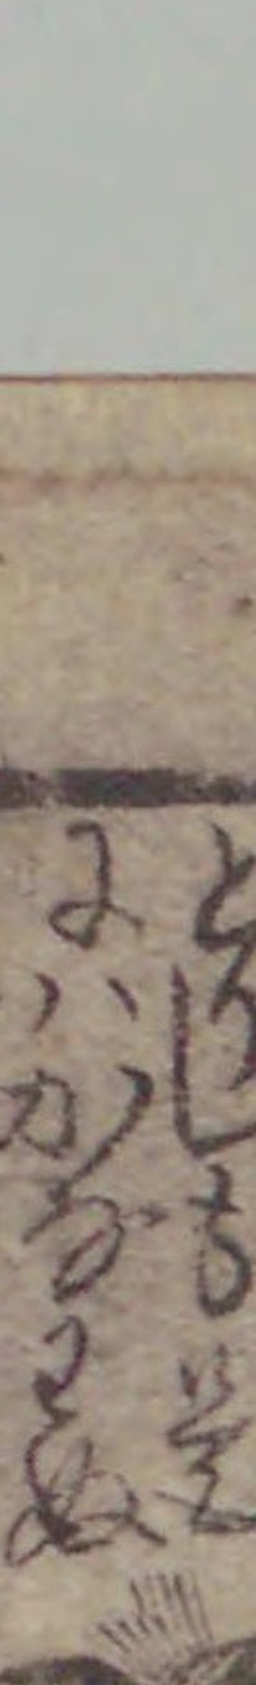にはかなわぬ
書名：近頃嶋めぐり 3巻
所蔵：国立国会図書館 National Diet Library, JAPAN
